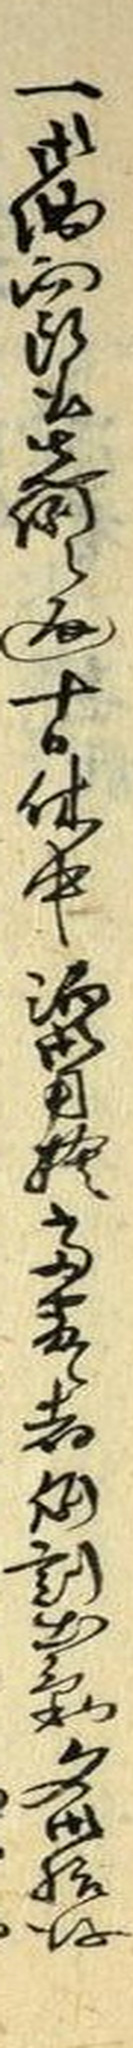一御側向頭取先例之通十日休中泊御用捨当番之者例刻出勤夕御膳後
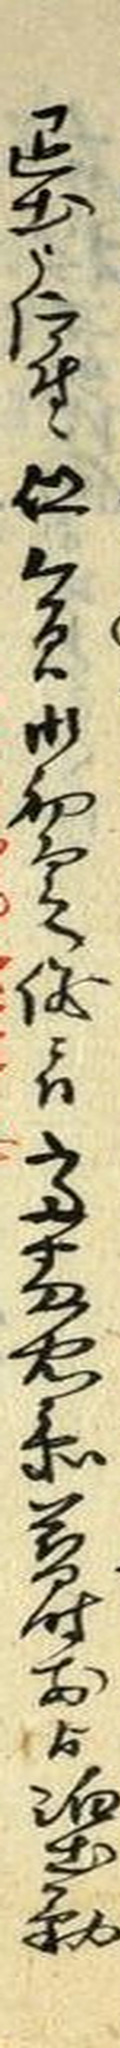退出被仰付候但今日ハ御初而之儀ニ付当番忠兵衛暮時前ゟ泊出勤
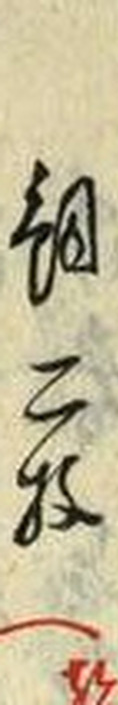鯛二枚
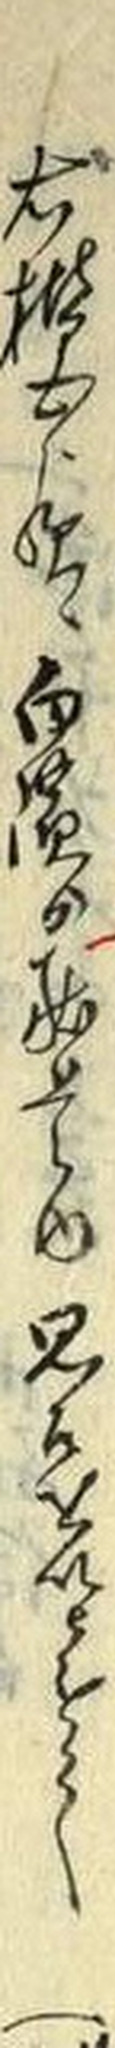右楷五郎様へ白浜ゟ献上之内思召を以被進之
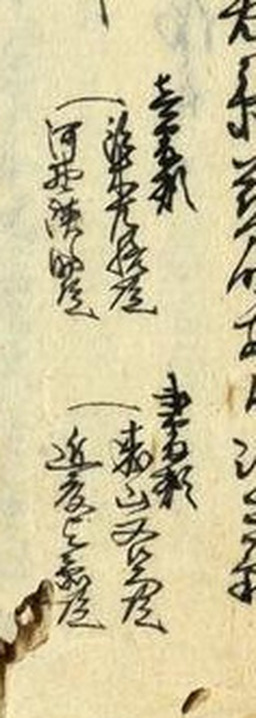鈴木左膳殿森山又左衛門殿
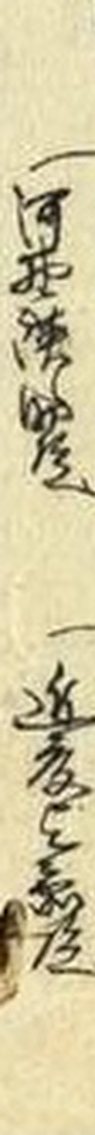河野鍈之助殿近藤与兵衛殿
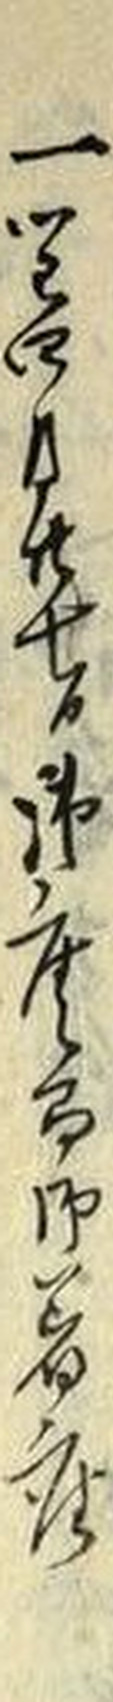一閏四月廿七日御座之間御着座
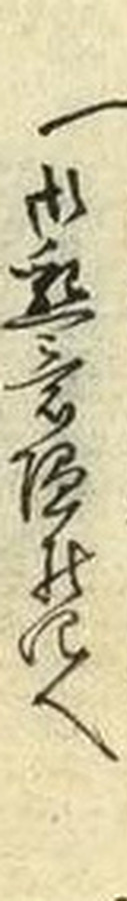御懇意隠居四人
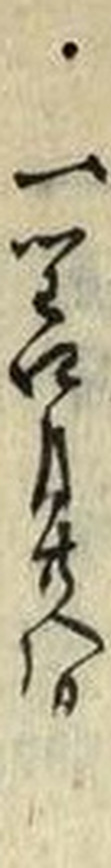一閏四月廿八日
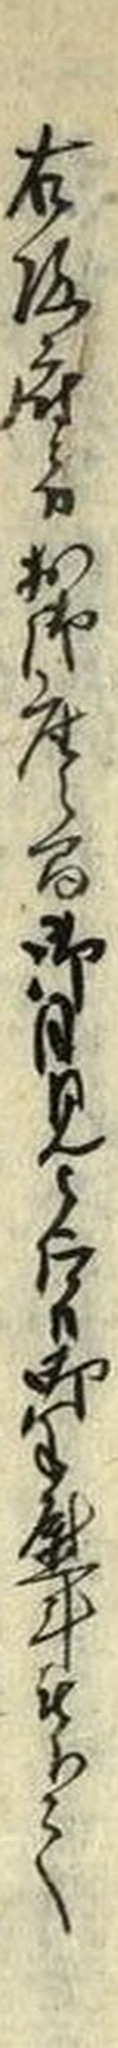右帰府ニ付於御座之間御目見被仰付御手熨斗被下之

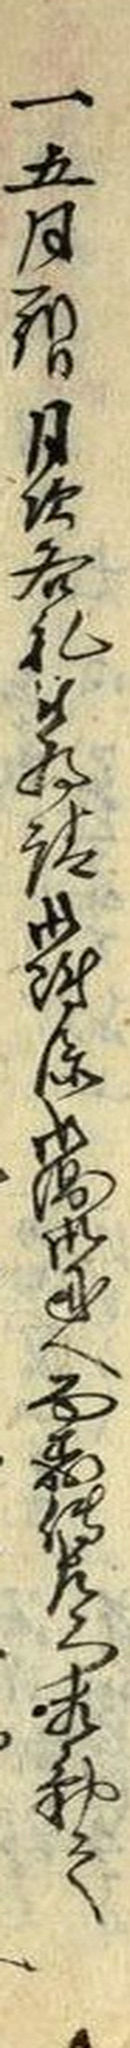一五月朔日月次各礼被為請御附添御側御用人雨森伝左衛門相勤之
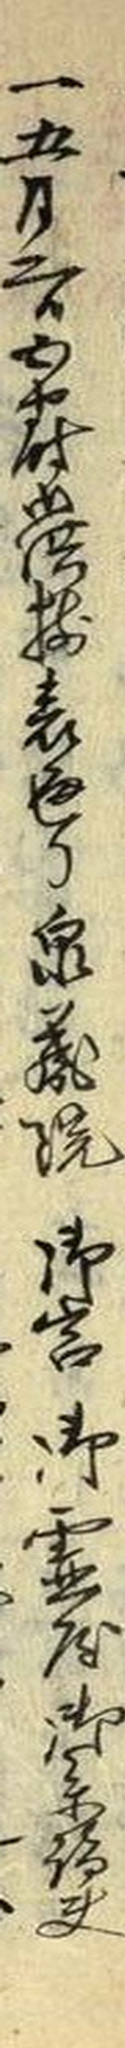一五月二日五半時御供揃表通り泉蔵院御宮御霊屋御参詣夫
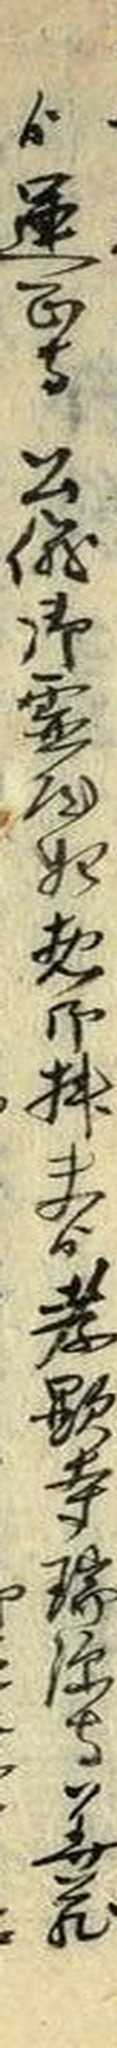ゟ運正寺公儀御霊屋始惣御拝夫ゟ孝顕寺瑞源寺華蔵
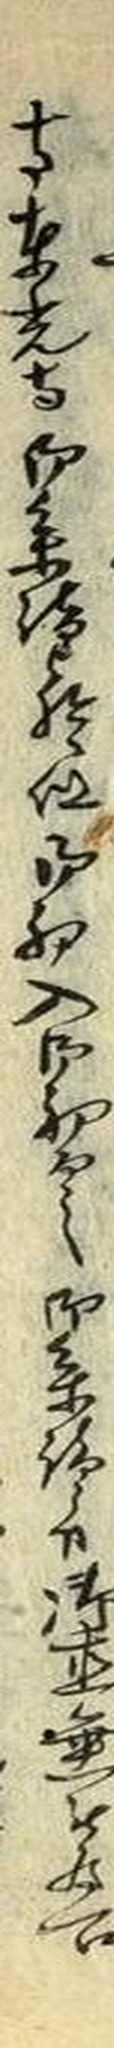寺東光寺御参詣被遊候但御初入御初而之御参詣ニ付御直垂被為召
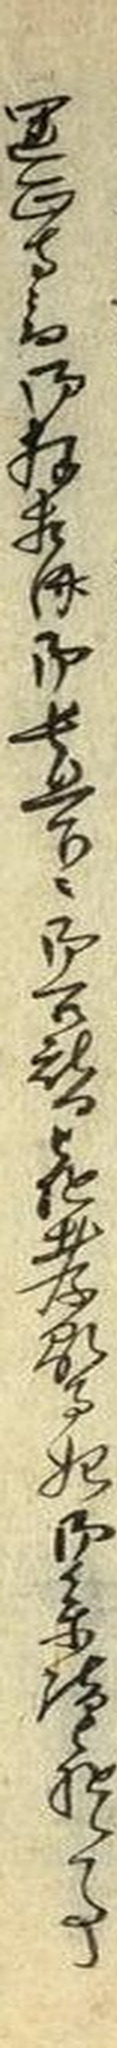運正寺ニ而御拝相済御長上下ニ御召替被遊孝顕寺始御参詣被遊候事
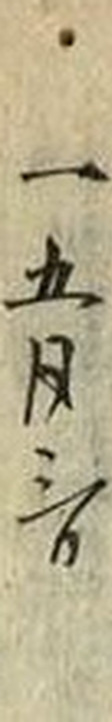一五月三日
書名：少傅日録抄（斉善付側向頭取日記、江戸并道中、初入在国、逝去後…
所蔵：福井県文書館 Fukui Prefectural Archives
